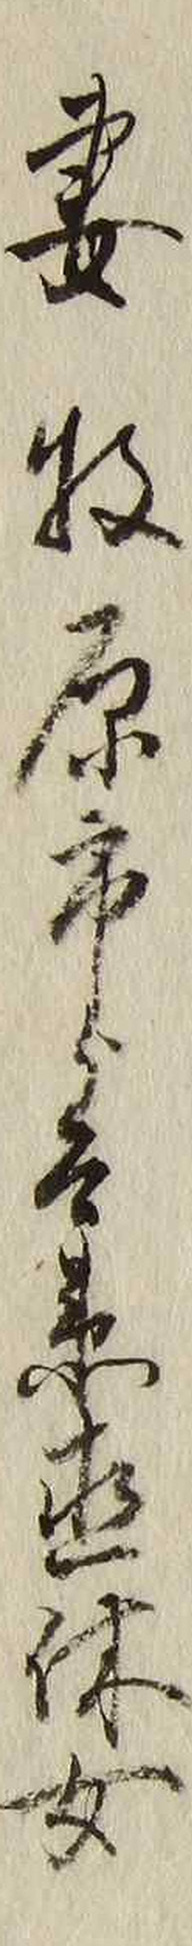妻牧原市郎兵衛直休女

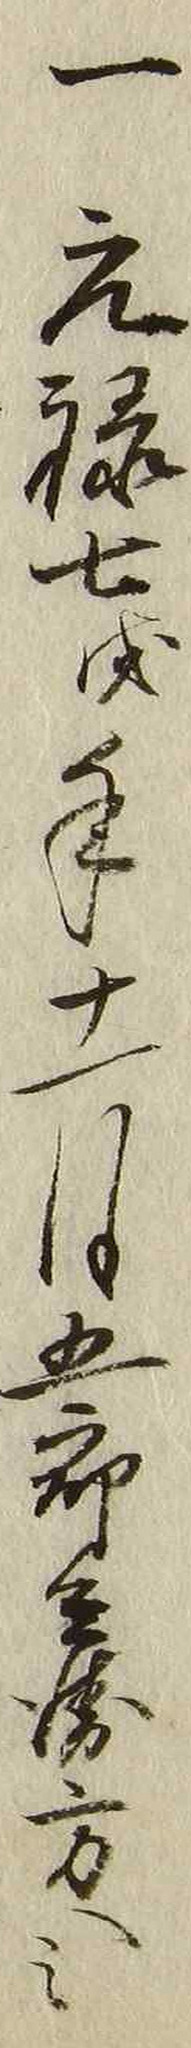一元禄七戌年十一月五郎兵衛方へ之
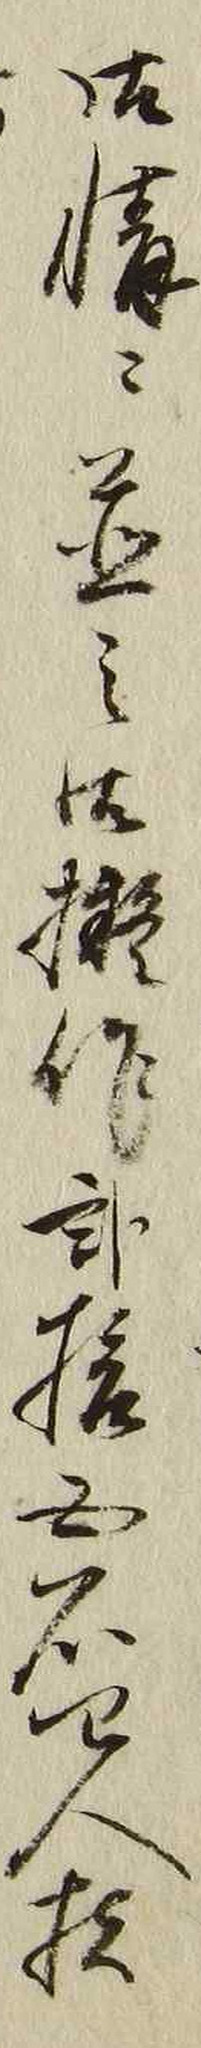御情ニ並之御擬作弐拾五石四人扶
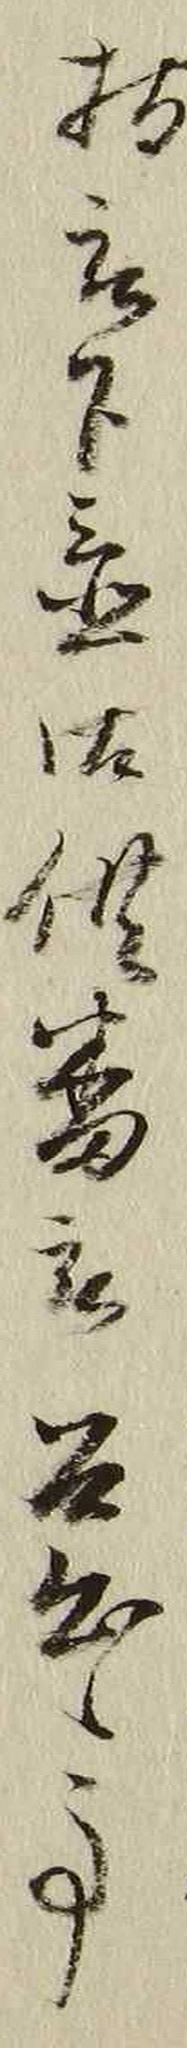持被下置御供番被召出候事
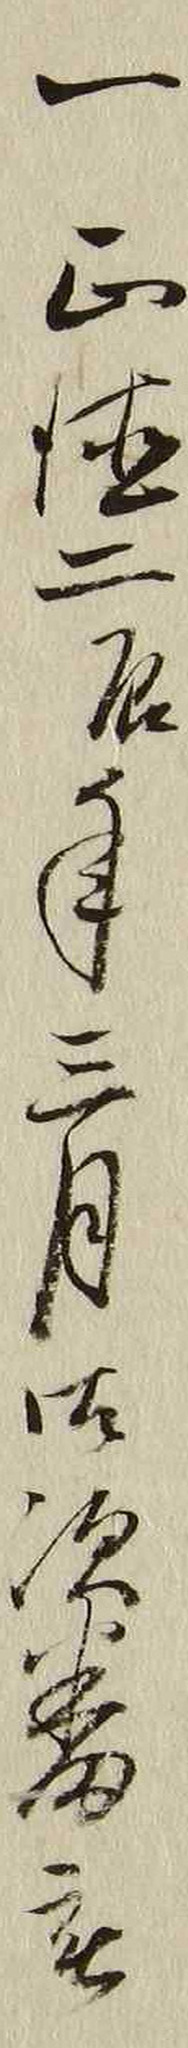一正徳二辰年三月御次番被
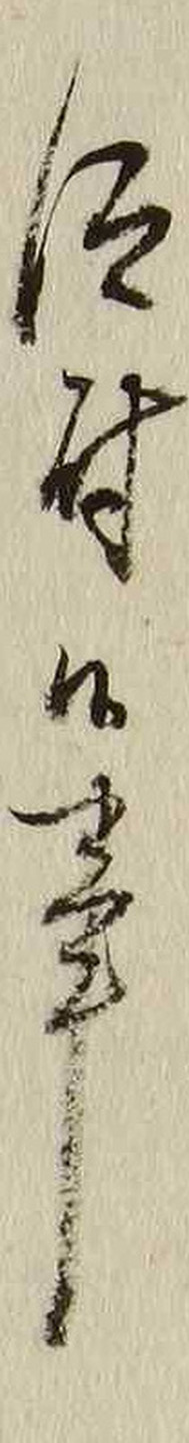仰付候事
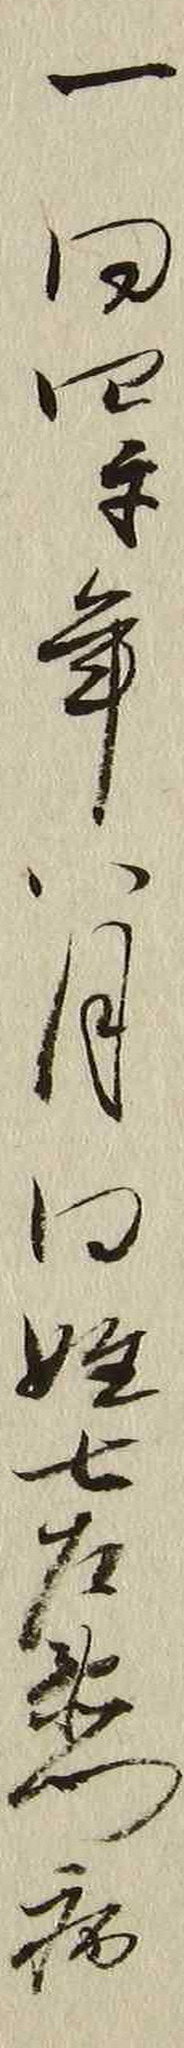一同四午年八月同姓七左衛門病
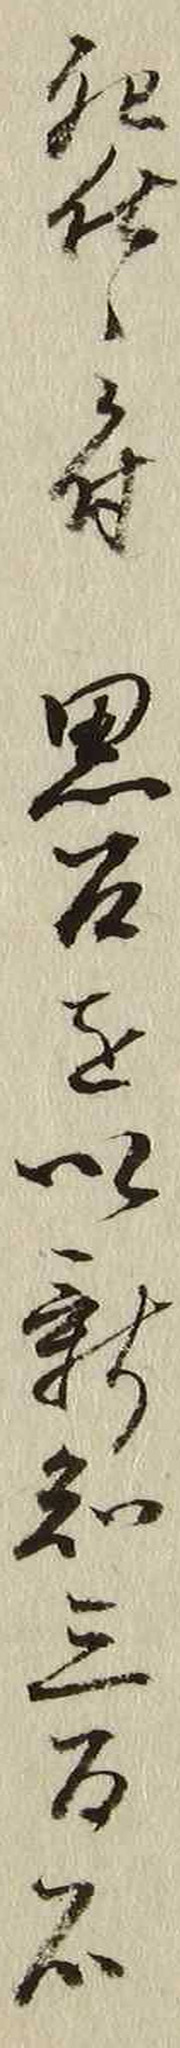死仕候ニ付思召を以新知三百石
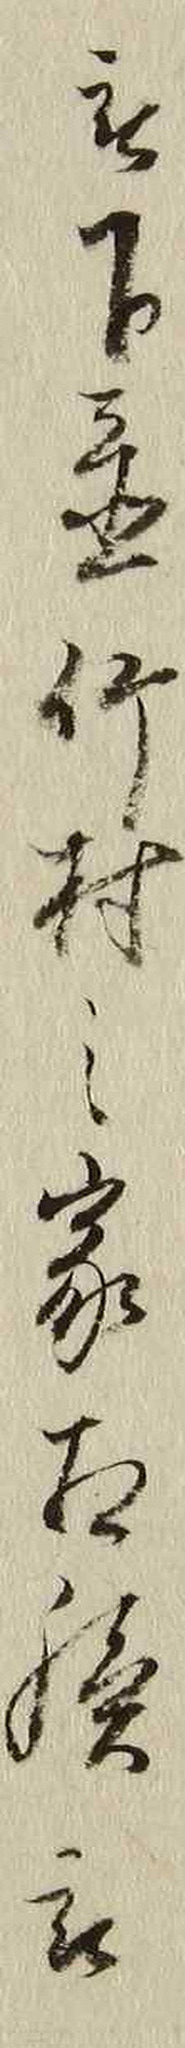被下置竹村之家相続被
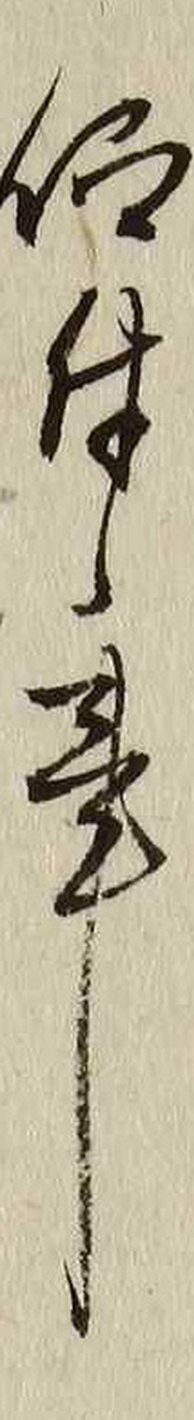仰付候事
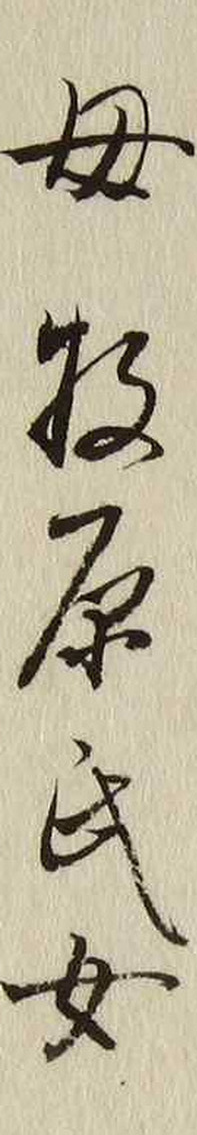母牧原氏女
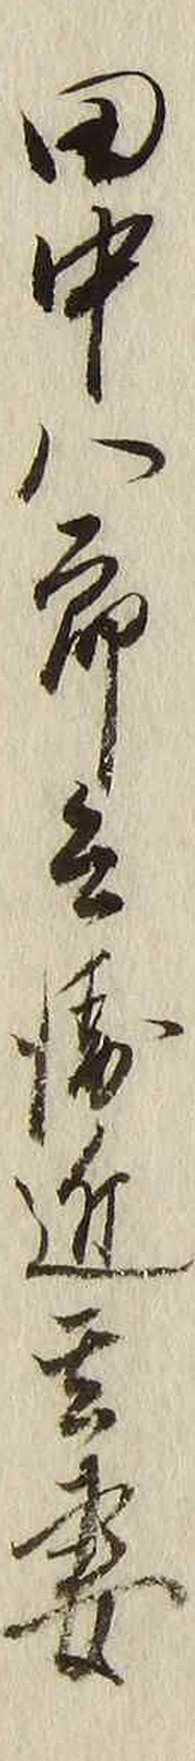田中八郎兵衛近玄妻

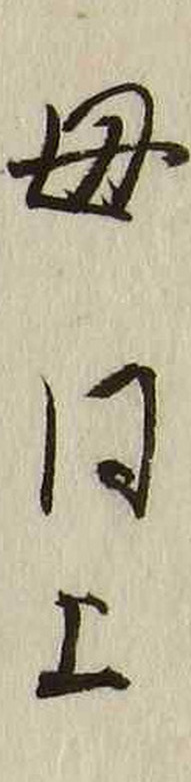母同上
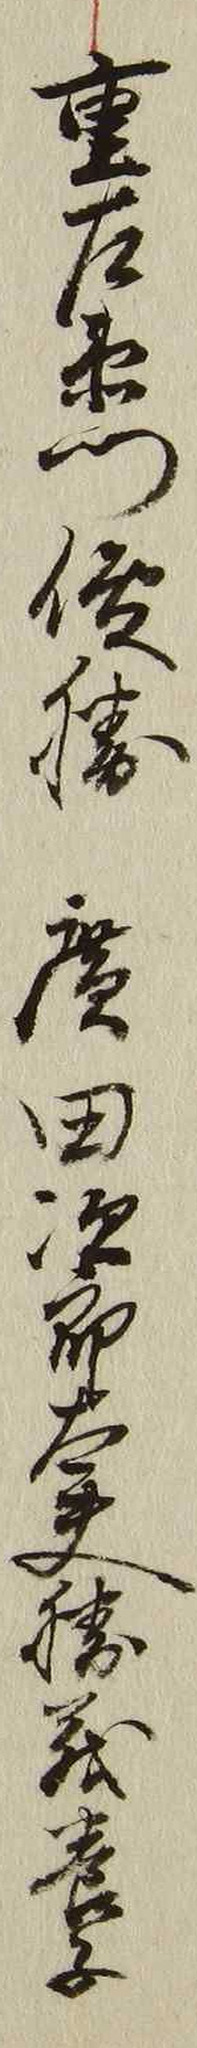重左衛門俊勝広田次郎太夫勝義養子
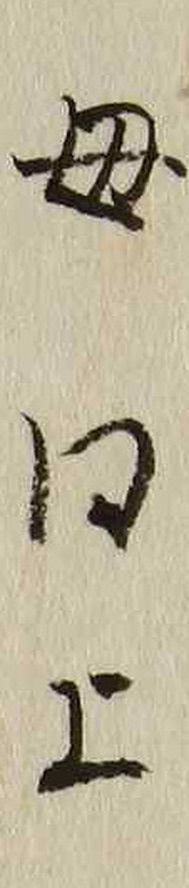母同上
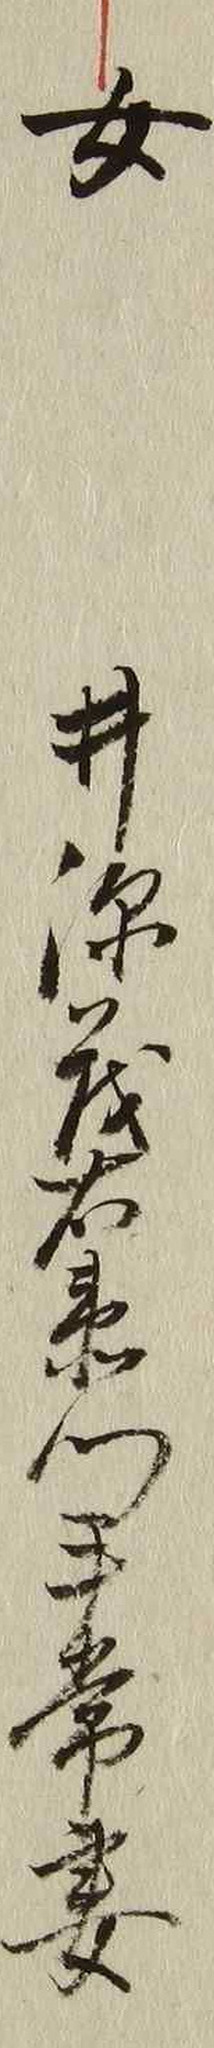女井深茂右衛門尹常妻
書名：諸士系譜　巻之351　す之部1
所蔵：会津若松市立会津図書館
